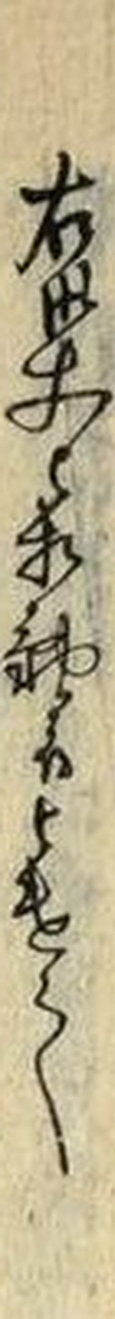右御使被相勤候ニ付被遣之
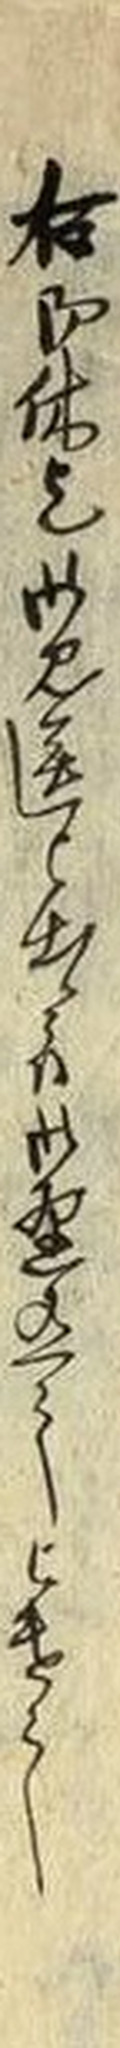右御休迄御見送被出候ニ付御逢有之被遣之
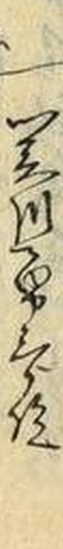関川勇三郎殿
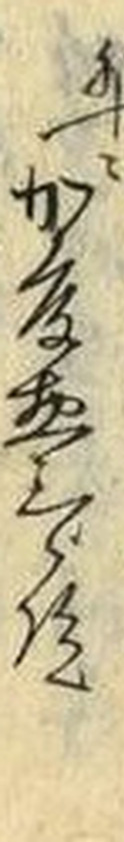加藤惣三郎殿
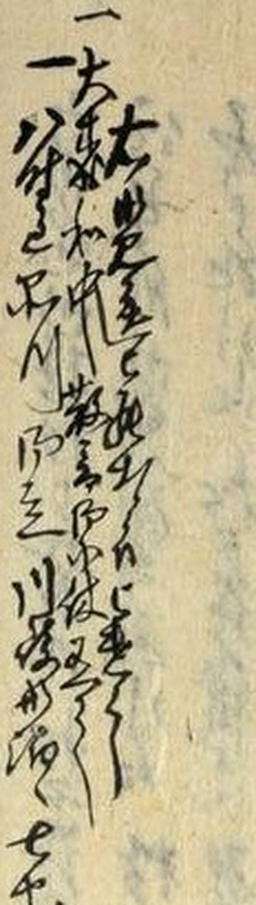右御見送被罷出候ニ付被遣之
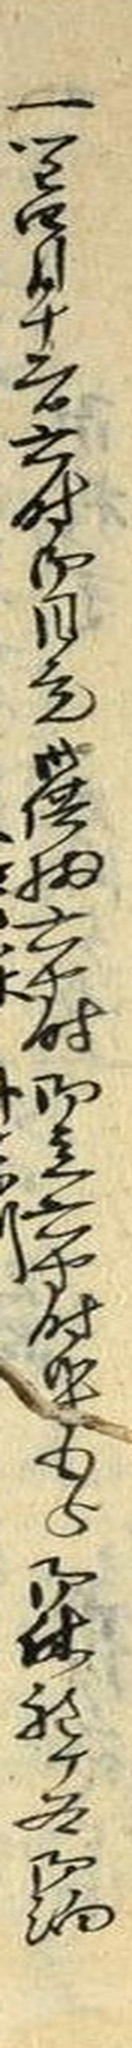一閏四月十二日六時御目覚御供揃六半時御立六半時弐寸五分御休程ヶ谷御泊
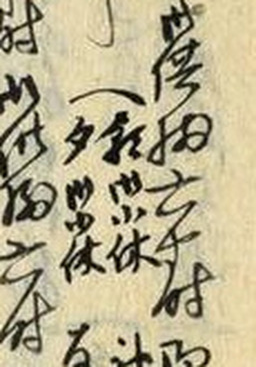朝御小休
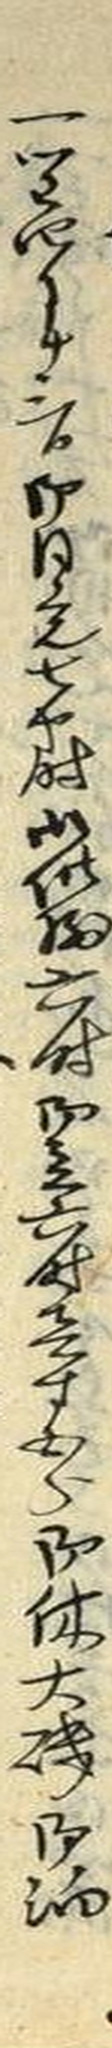一閏四月十三日御目覚七半時御供揃六時御立六時壱寸五分御休大磯御泊
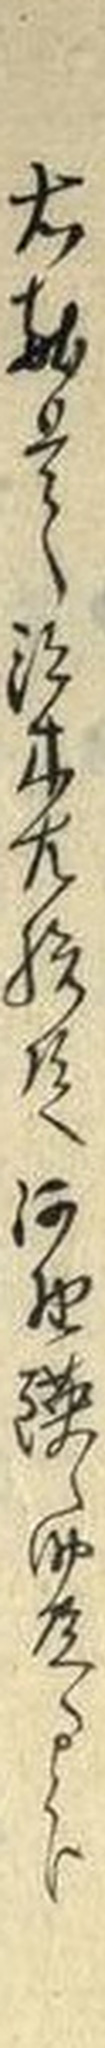右献上之鈴木左膳殿河野鍈之助殿へ被下
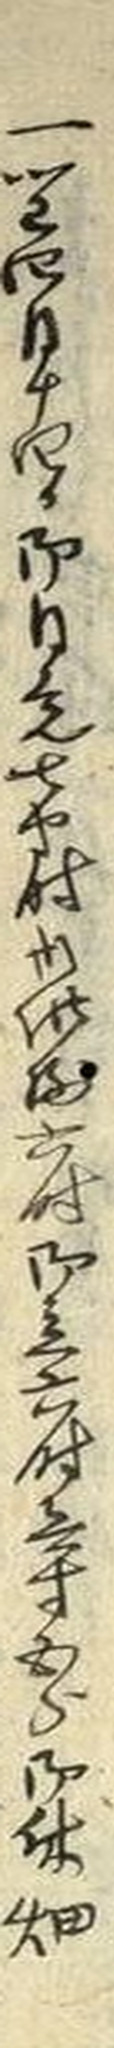一閏四月十四日御目覚七半時御供揃六時御立六時壱寸五分御休畑
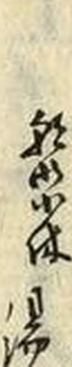朝御小休
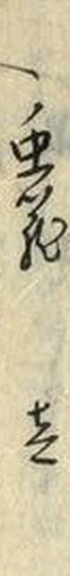虫籠壱
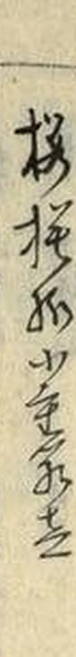桜模様小重箱壱

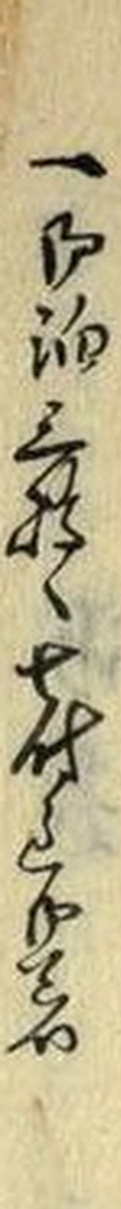一御泊三嶋へ七時過御着
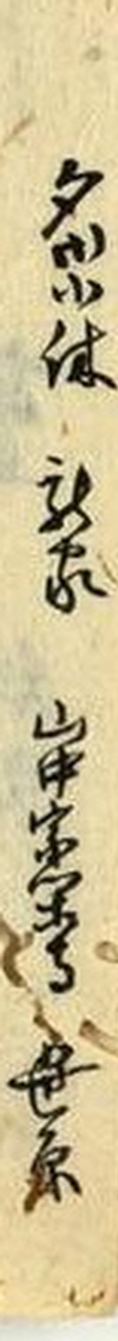夕御小休新家山中宗閑寺笹原
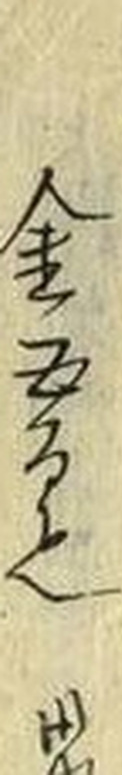金千五百疋
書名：少傅日録抄（斉善付側向頭取日記、江戸并道中、初入在国、逝去後…
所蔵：福井県文書館 Fukui Prefectural Archives
